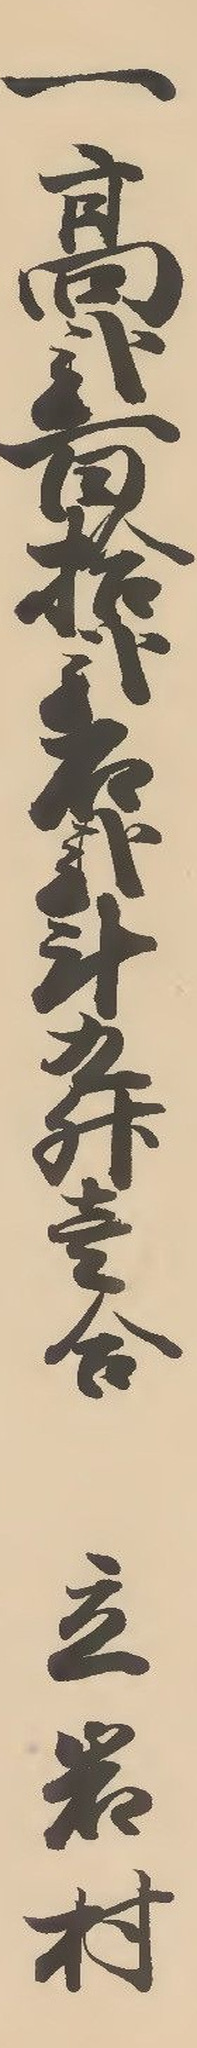一髙弐百拾弐石弐斗九升壱合立岩村
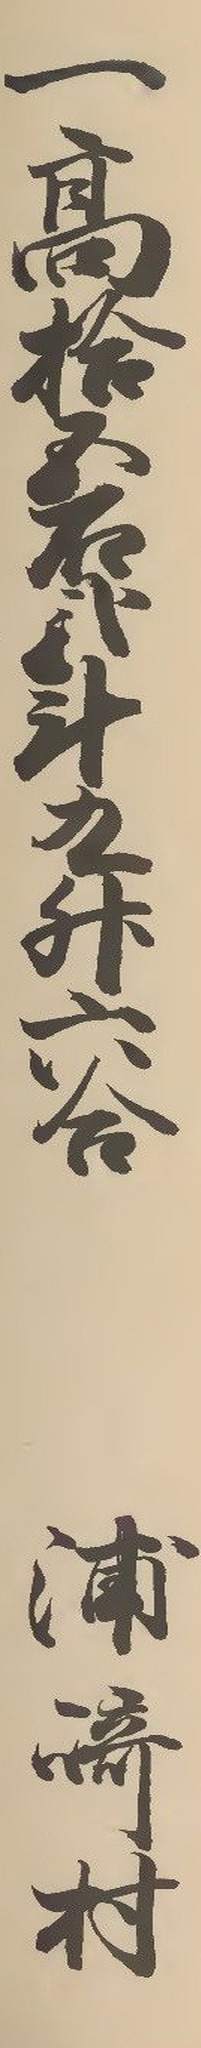一髙拾五石弐斗九升六合浦崎村
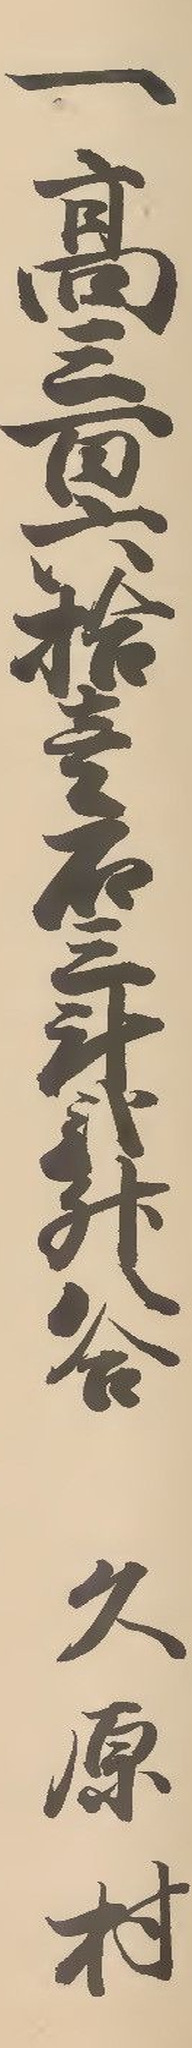一髙三百六拾壱石三斗弐升八合久原村
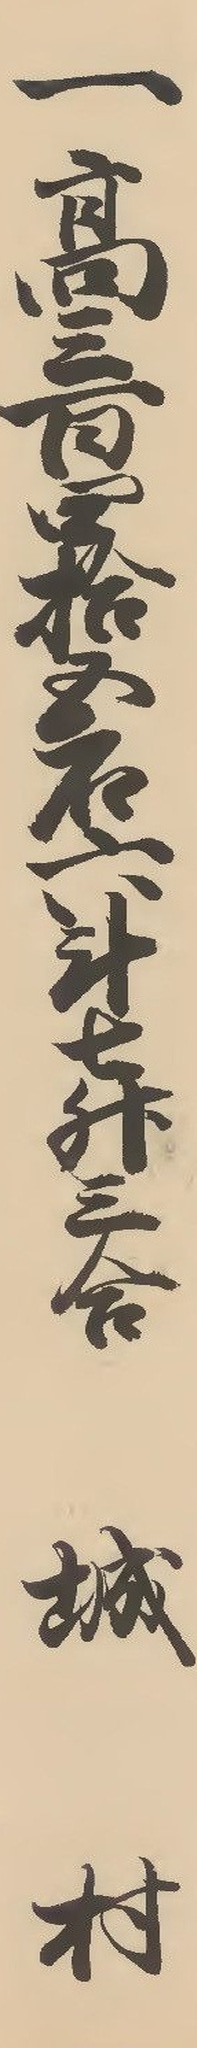一髙三百四拾五石六斗七升三合城村
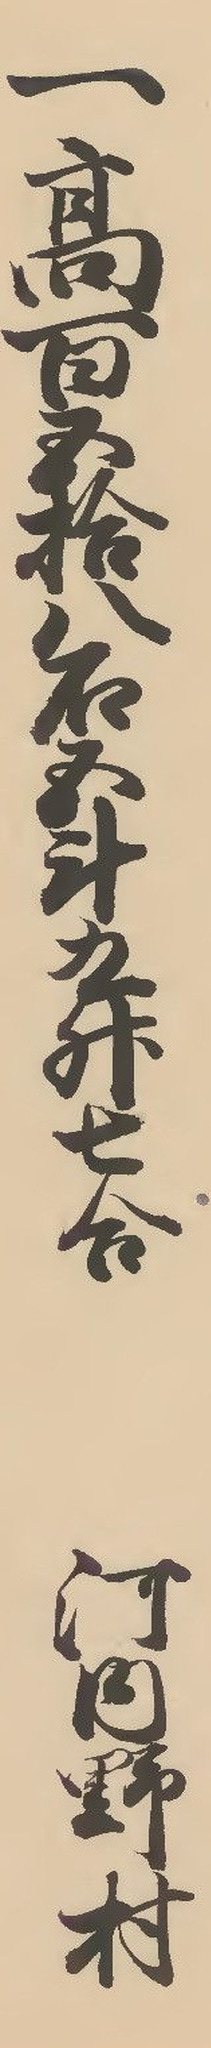一髙百五拾八石五斗九升七合河内野村

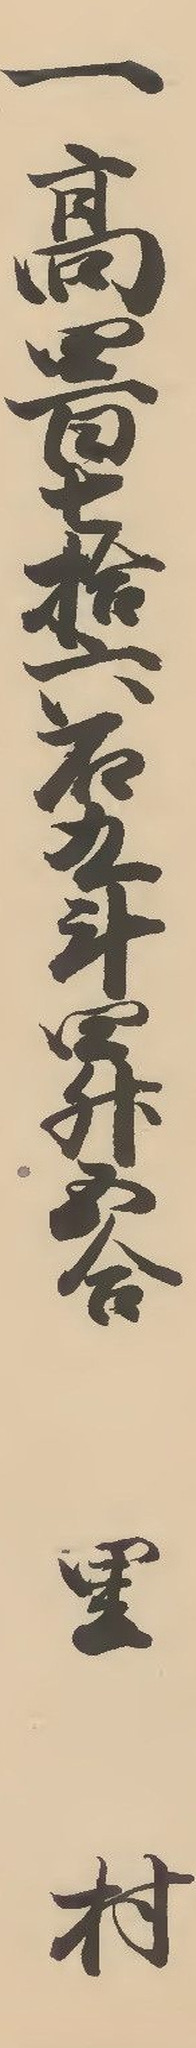一髙四百七拾六石九斗四升五合里村
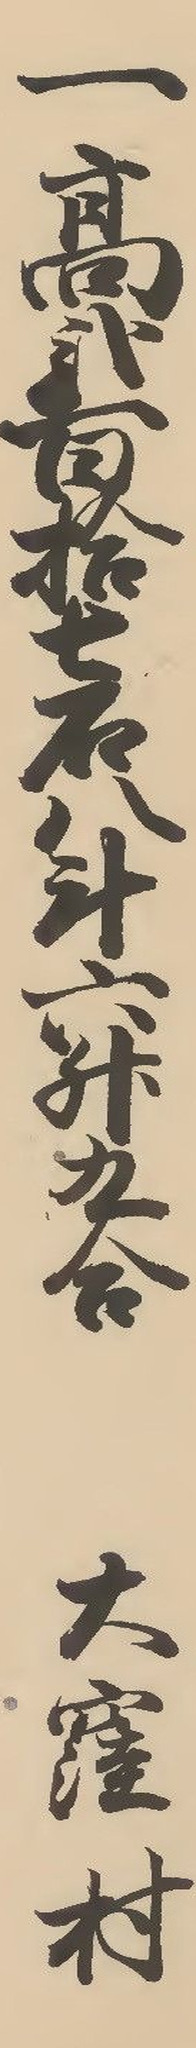一髙弐百拾七石八斗六升九合大窪村
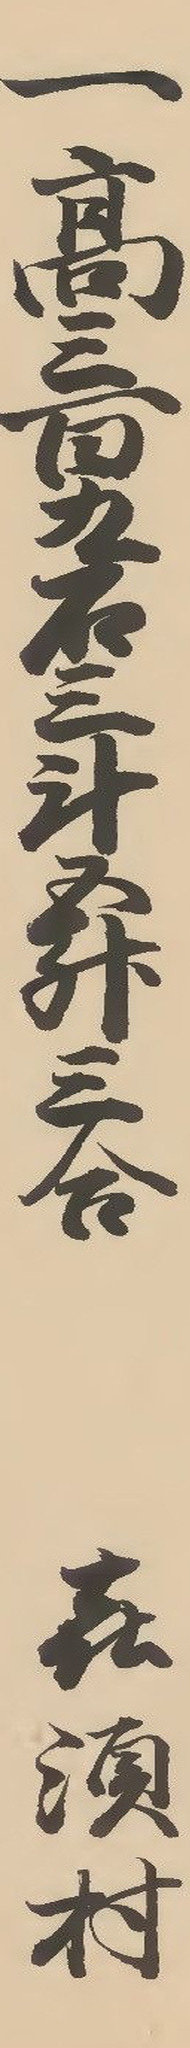一髙三百九石三斗五升三合喜須村
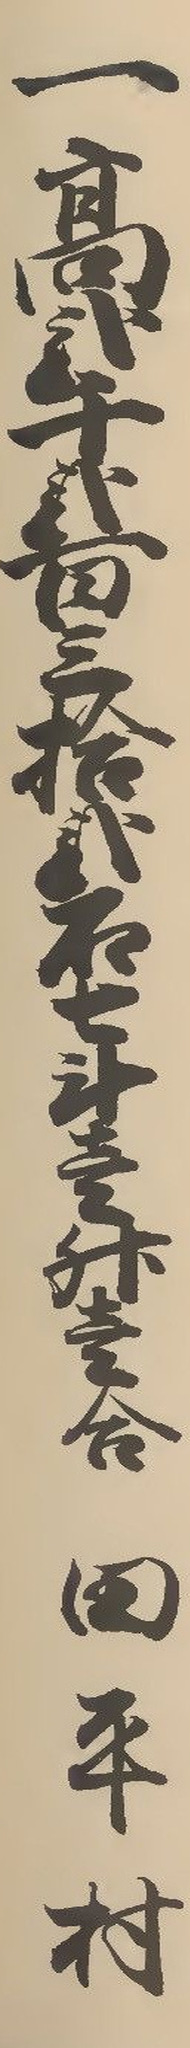一髙弐千弐百三拾弐石七斗壱升壱合田平村
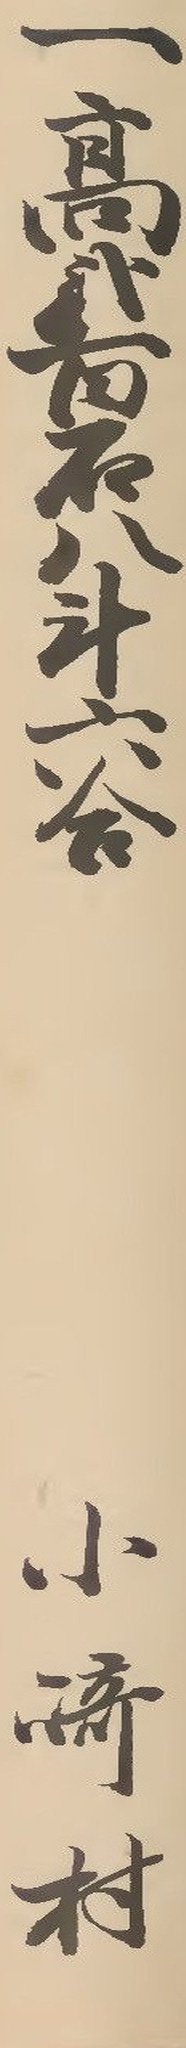一髙弐百石八斗六合小崎村
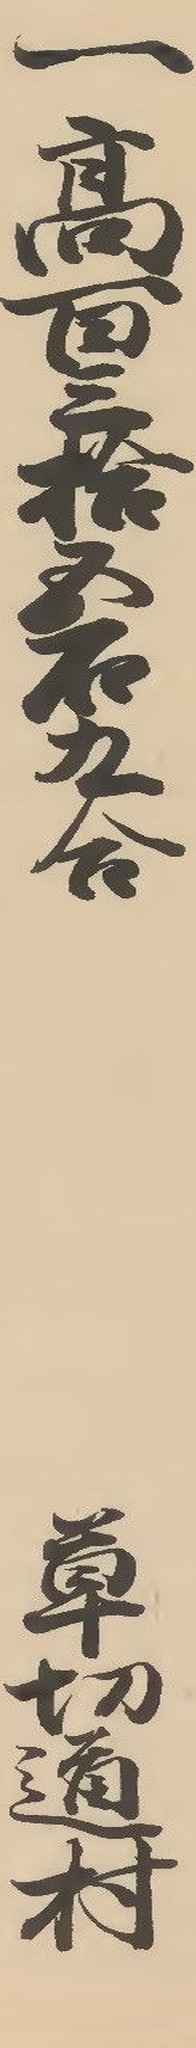一髙百三拾五石九合草切通村
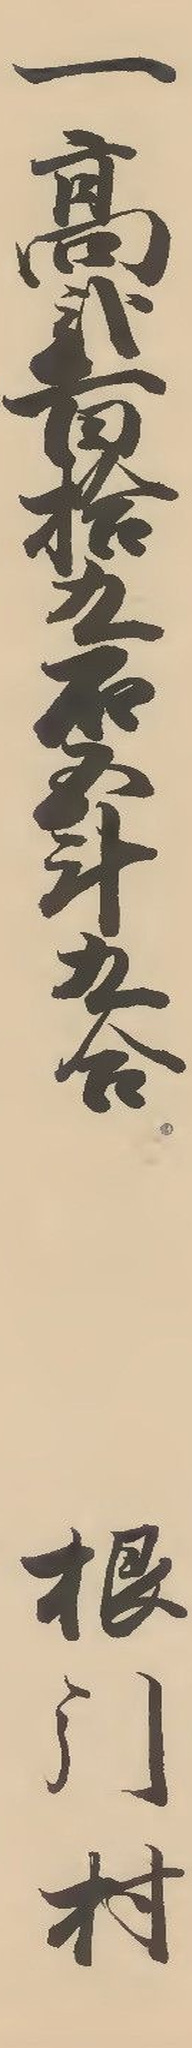一髙弐百拾九石五斗九合根川村
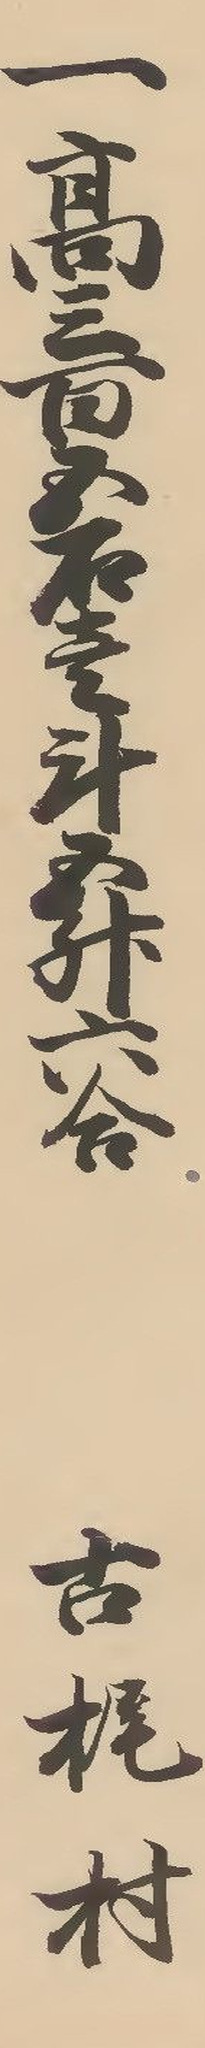一髙三百五石壱斗五升六合古梶村

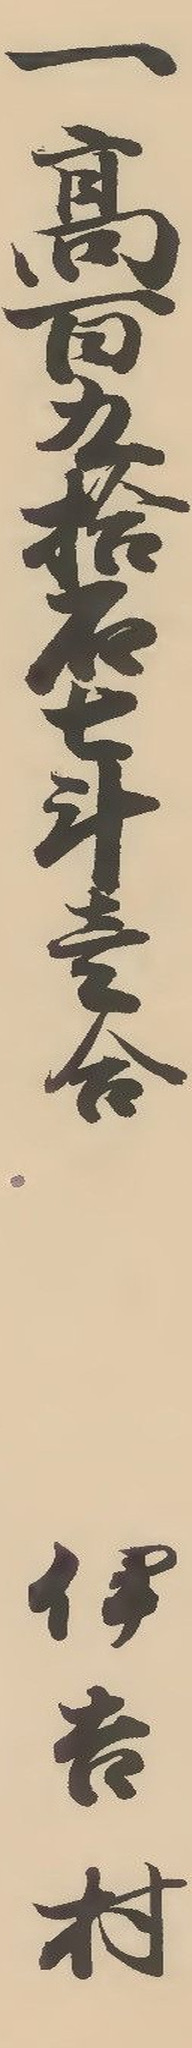一髙百九拾石七斗壱号伊吉村
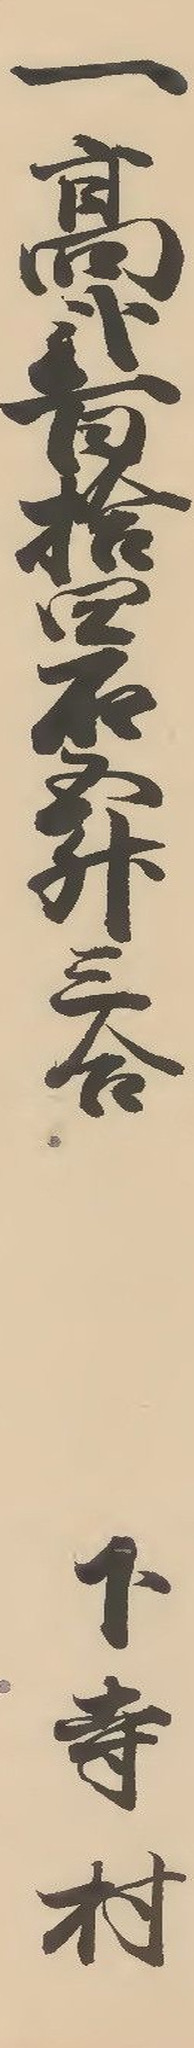一髙弐百拾四石五升三合下寺村
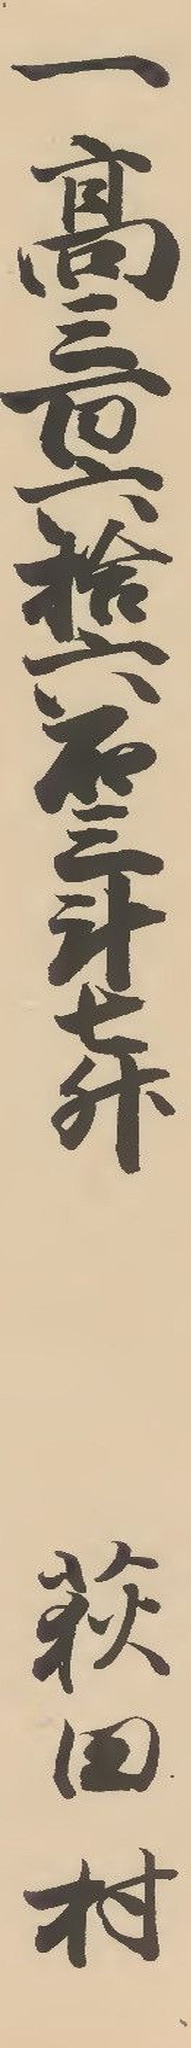一髙三百六拾六石三斗七升萩田村
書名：肥前国郷帳
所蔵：国立公文書館 National Archives of Japan
